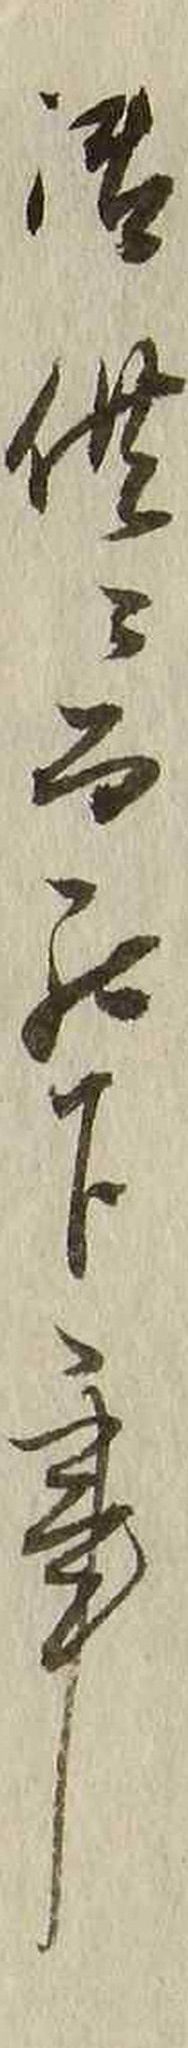御供ニ而罷下候事
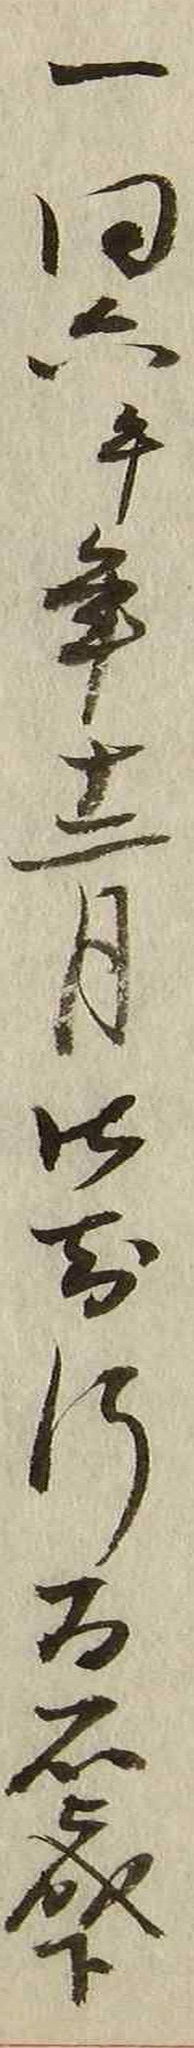一同六午年十二月御知行百石被成下
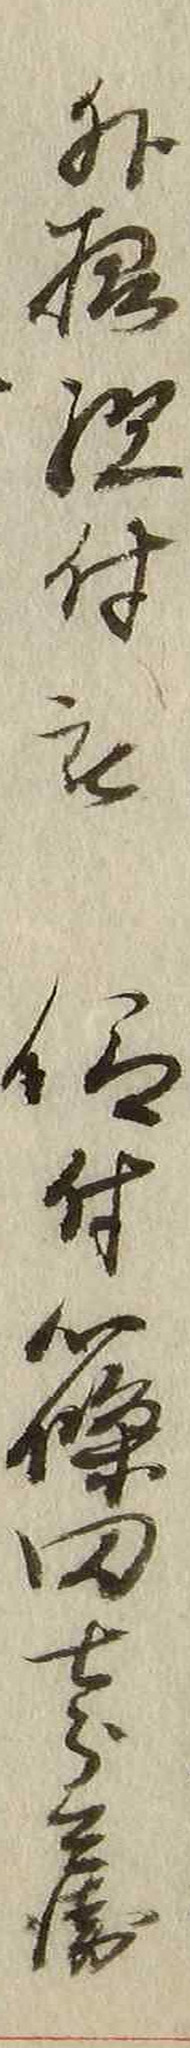外様組付被仰付篠田七郎兵衛
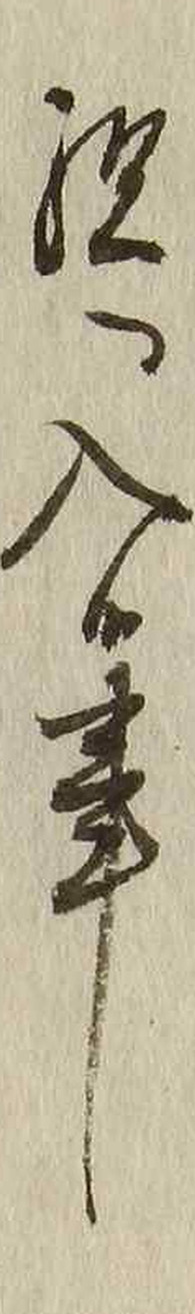組へ入候事
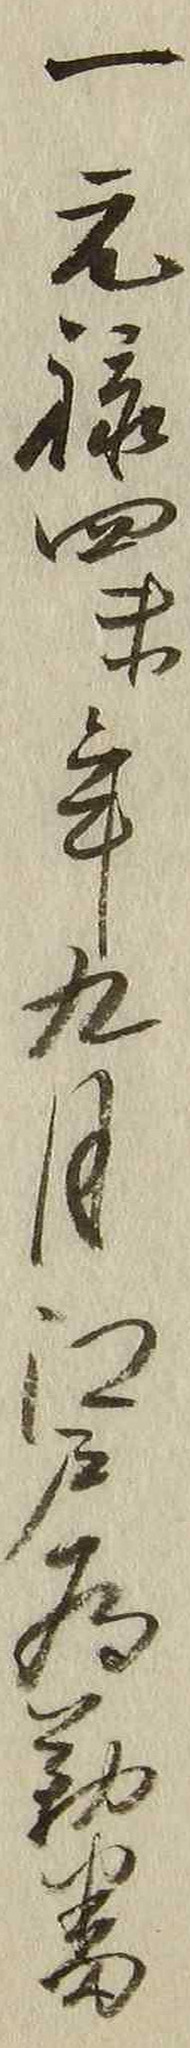一元禄四末年九月江戸為勤番
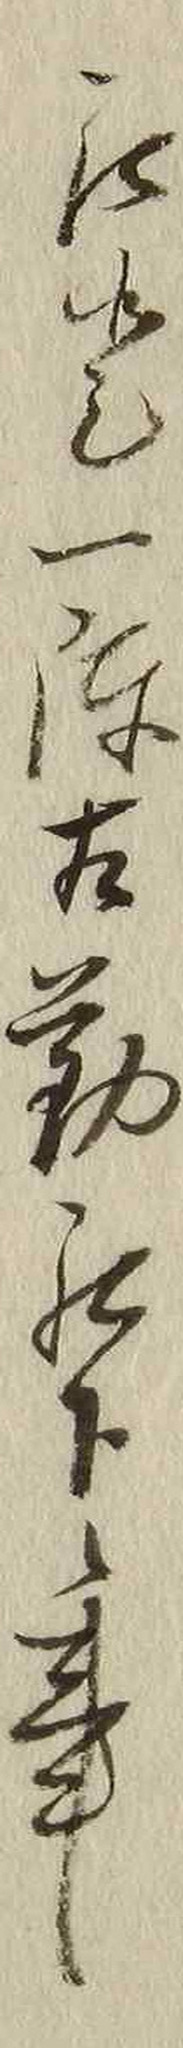罷登一陣相勤罷下候事
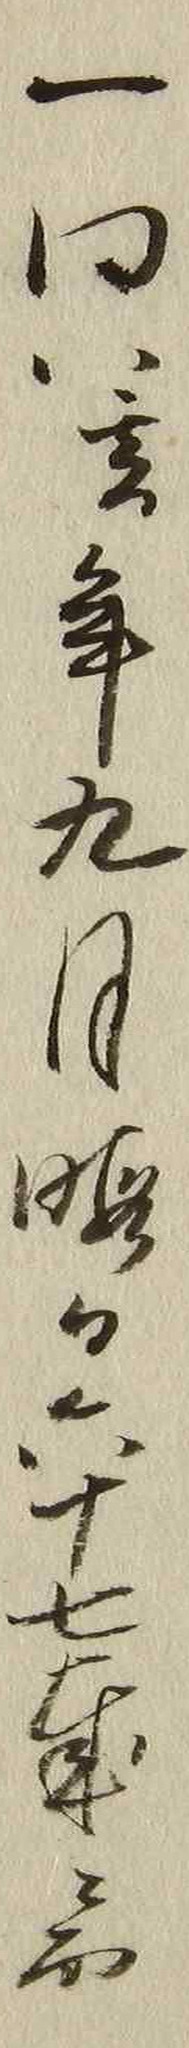一同八亥年九月晦日六十七歳ニ而
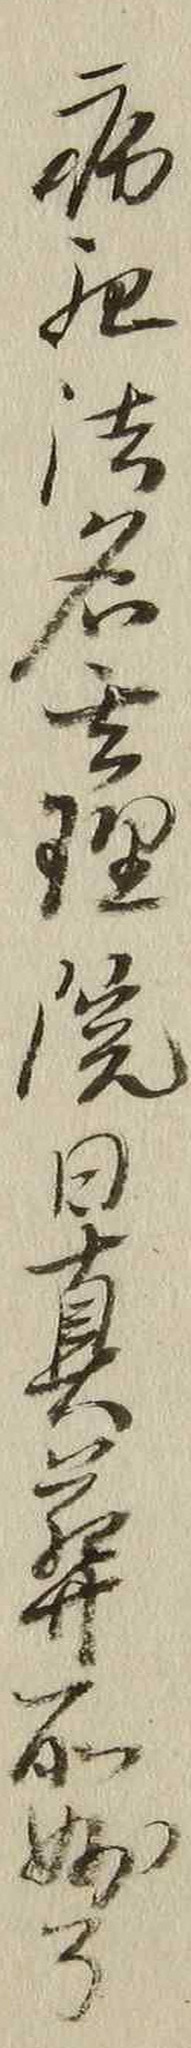病死法名玄理院日真葬所妙了
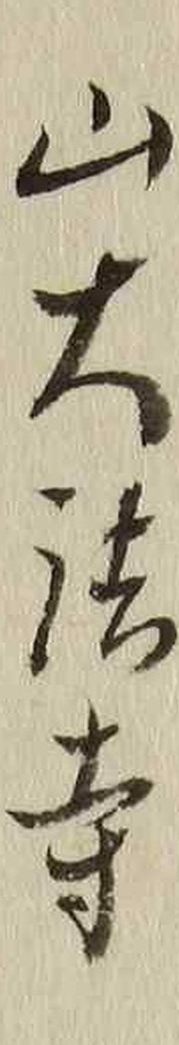山大法寺
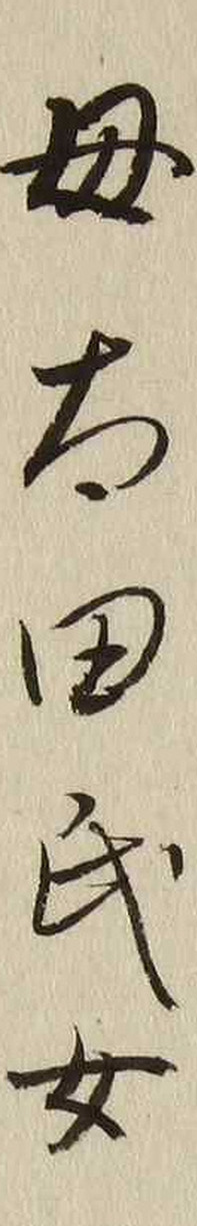母太田氏女
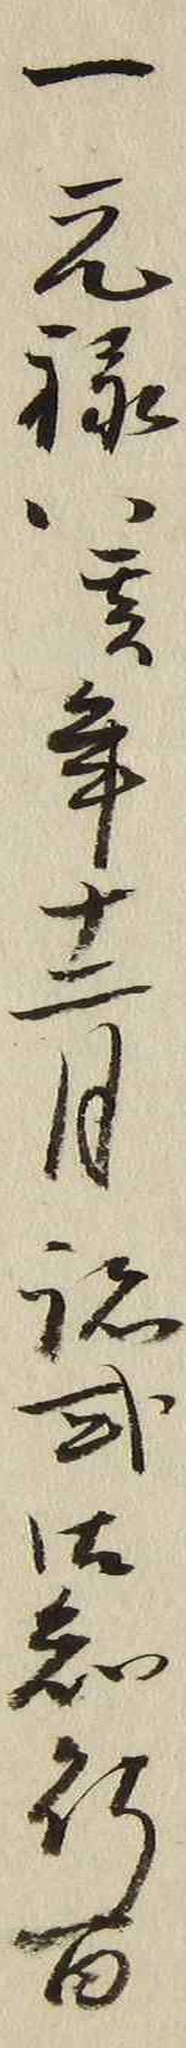一元禄八亥年十二月跡式御知行百
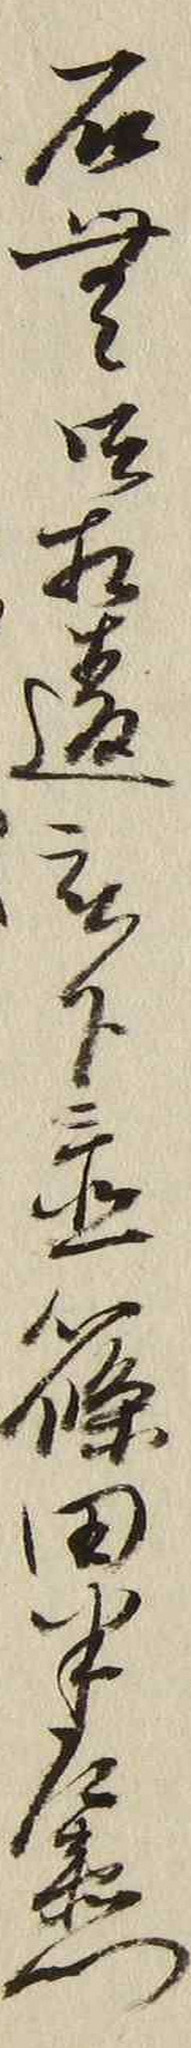石無御相違被下置篠田半左衛門
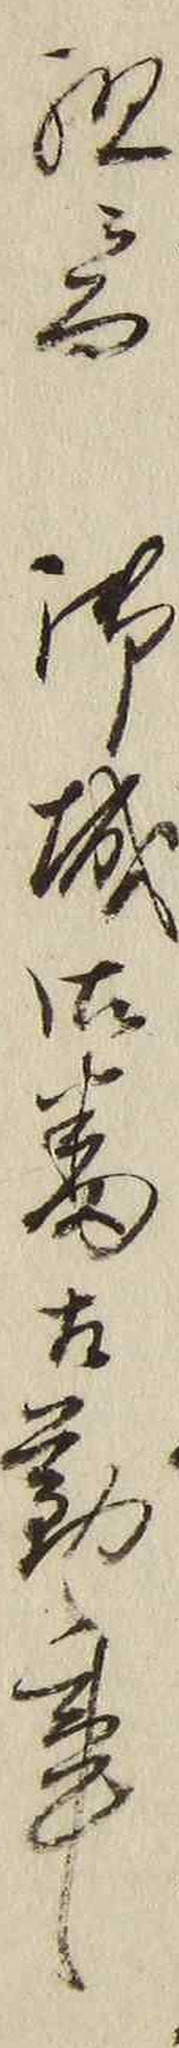組ニ而御城御番相勤候事

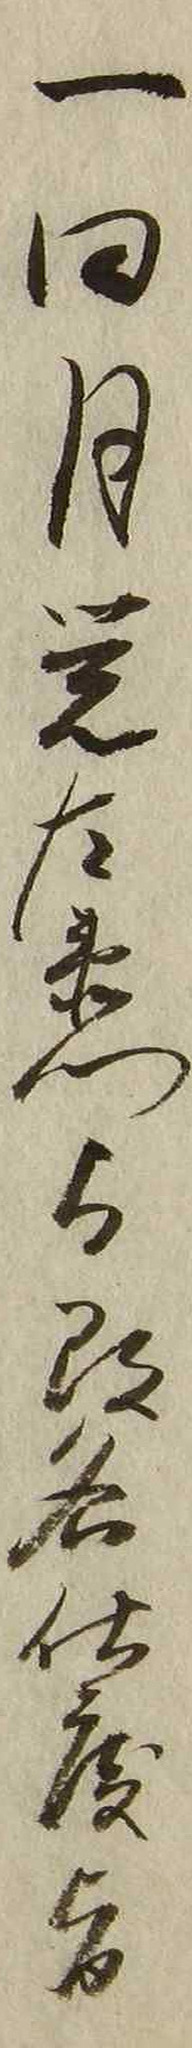一同月覚左衛門与改名仕度旨
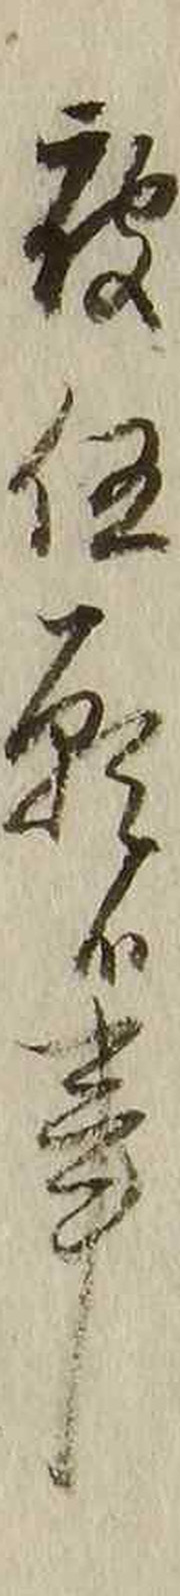被任願候事
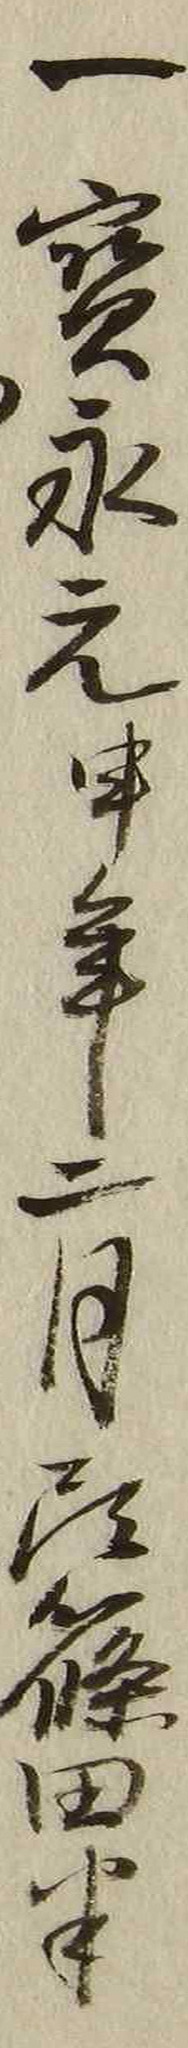一宝永元申年二月頭篠田半
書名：諸士系譜　巻之352　す之部2
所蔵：会津若松市立会津図書館
